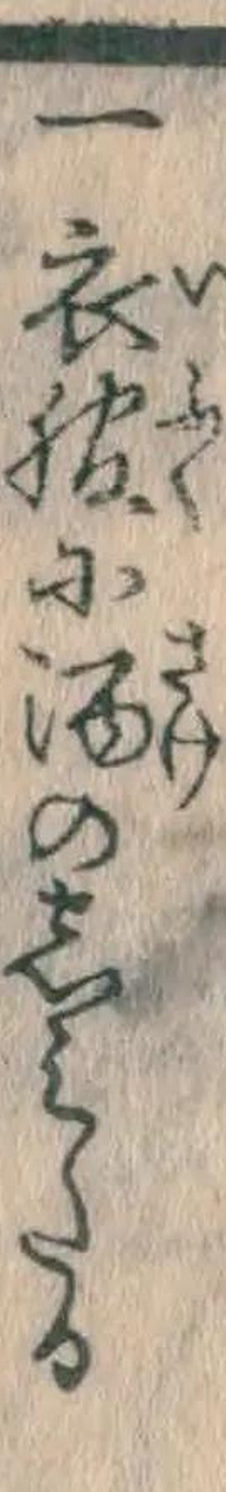一衣服に酒のしみたる
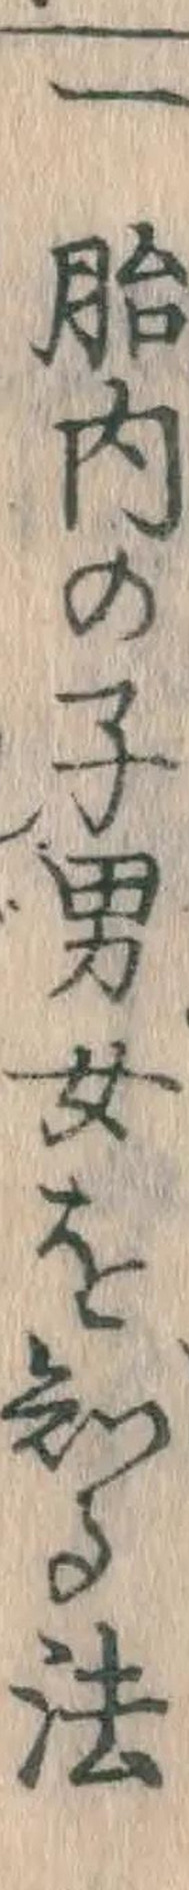一胎内の子男女を知る法
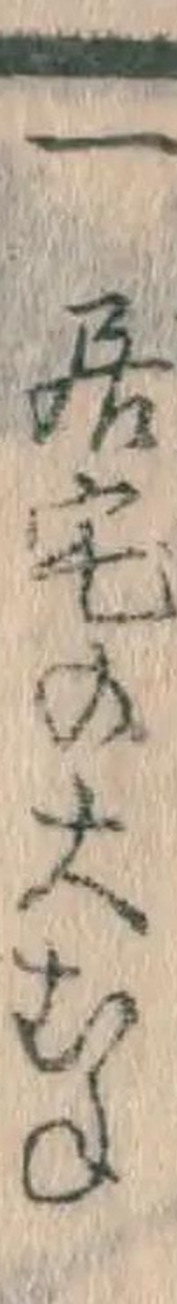一居宅の大むね
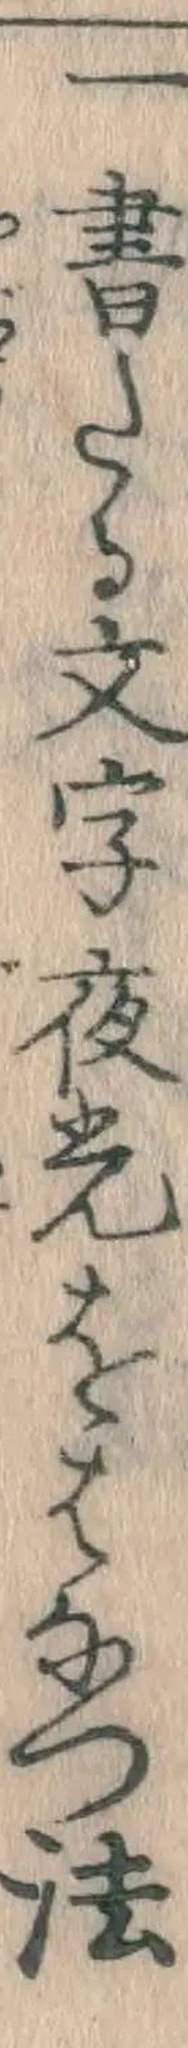一書たる文字夜光をはなつ法
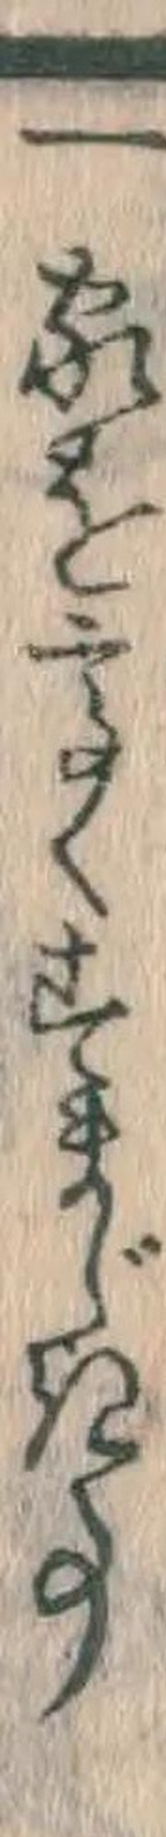一家を高くすまじき事
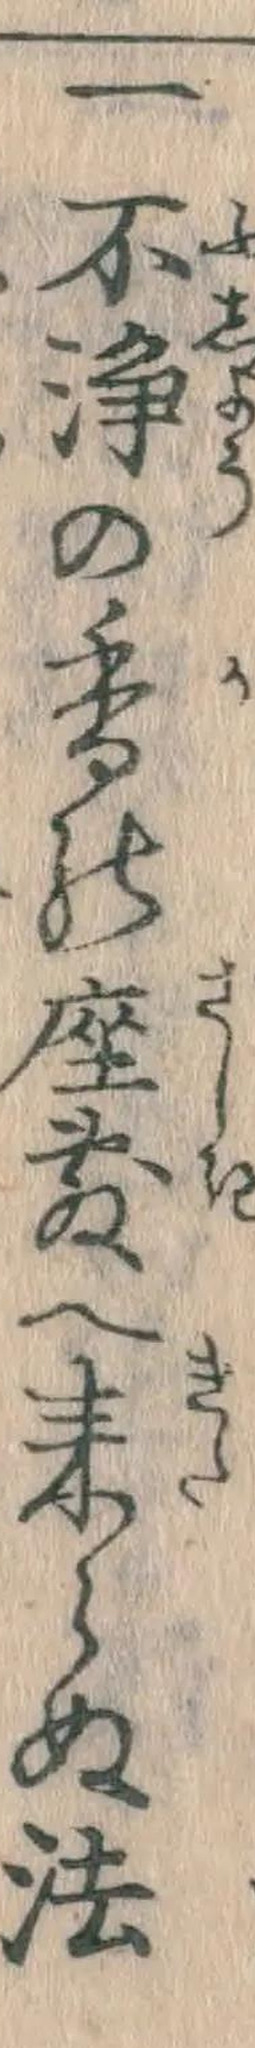一不浄の香の座敷へ来らぬ法
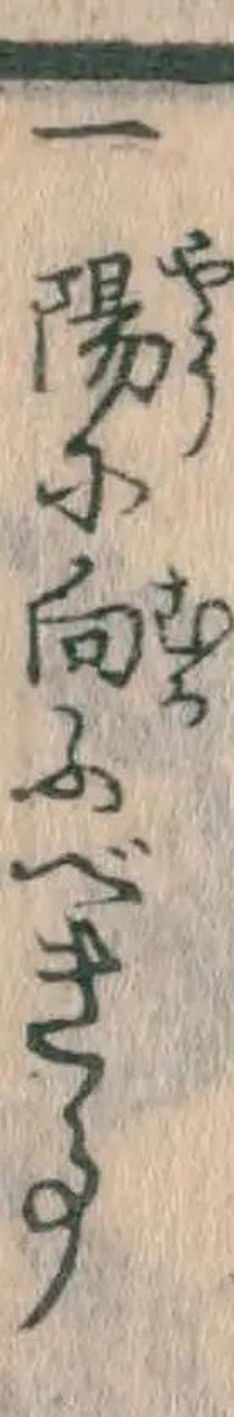一陽に向ふべき事
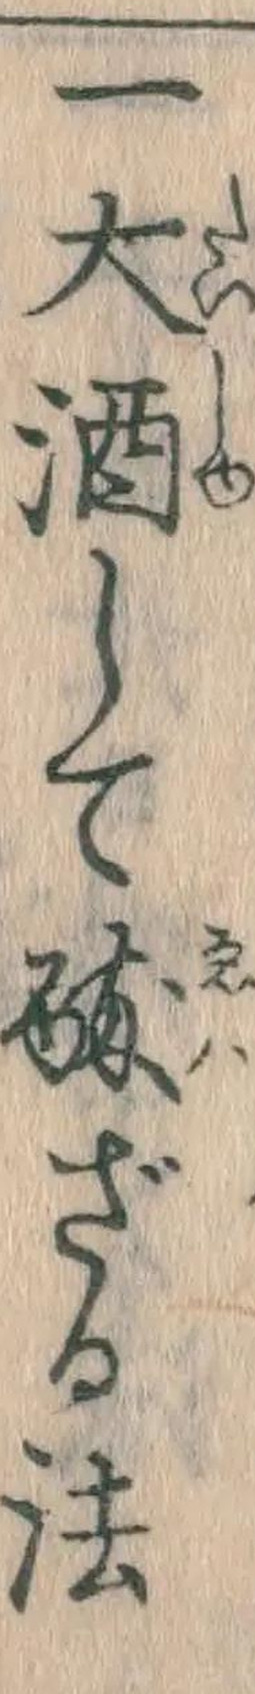一大酒して酔ざる法
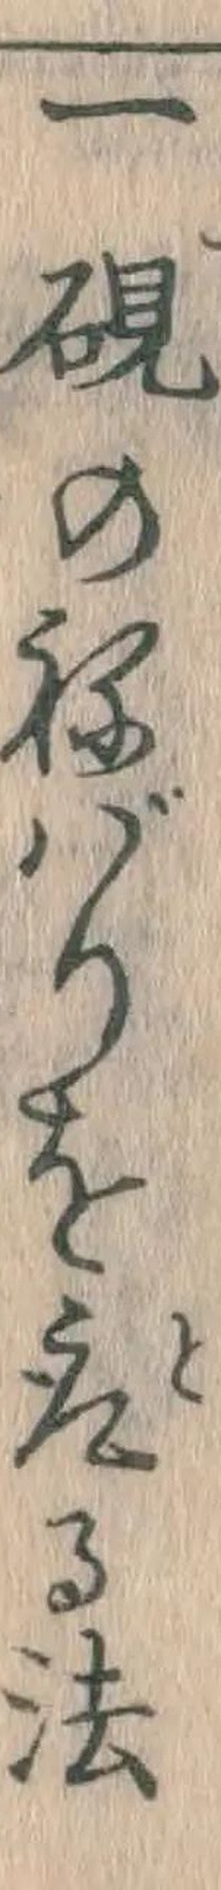一硯のねばりを取る法
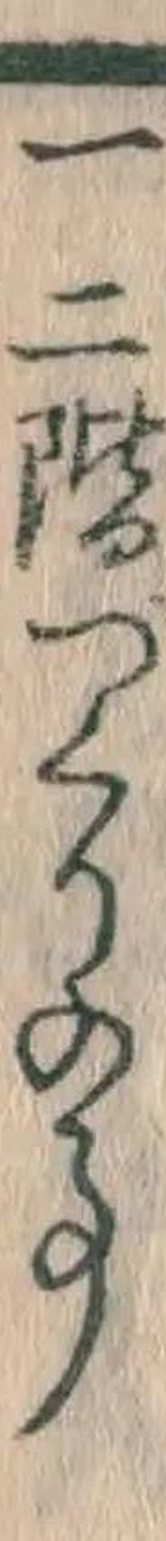一二階づくりの事
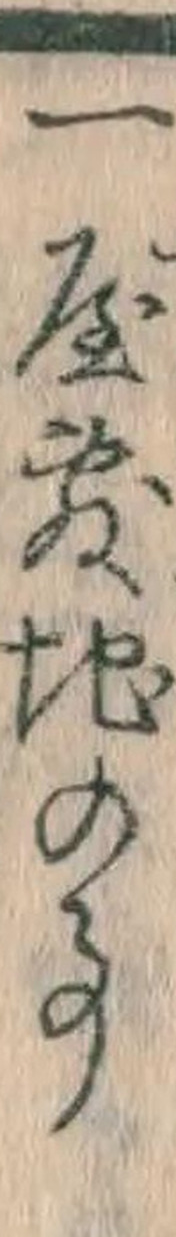一屋敷地の事
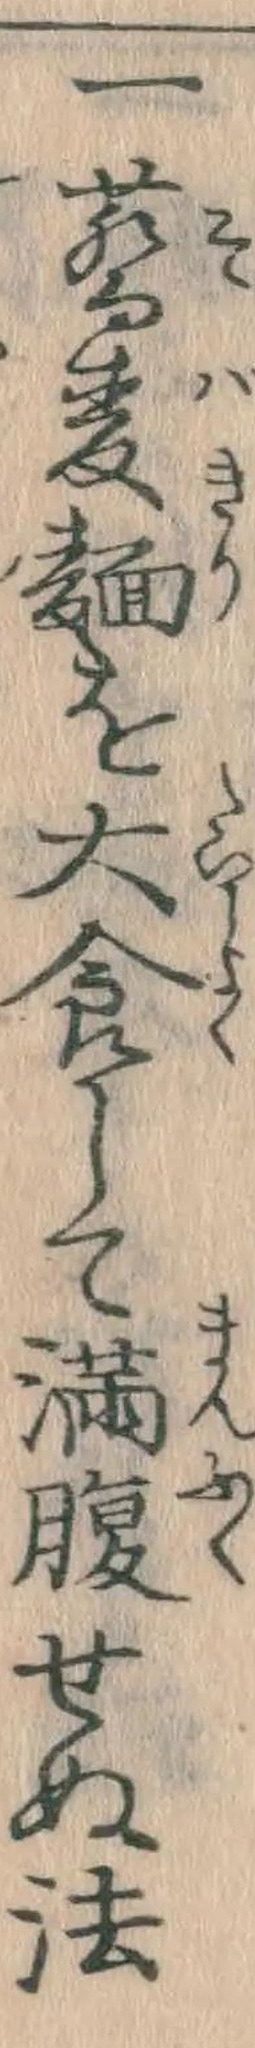一蕎麦麺を大食して満腹せぬ法
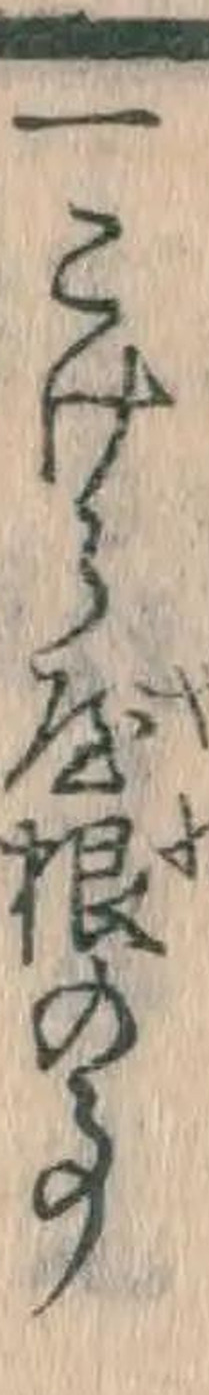一こけら屋根の事
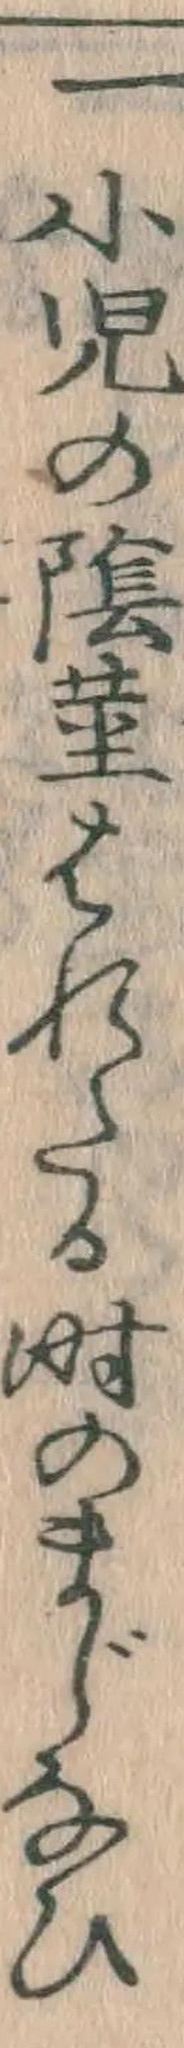一小児の陰茎はれたる時のまじなひ
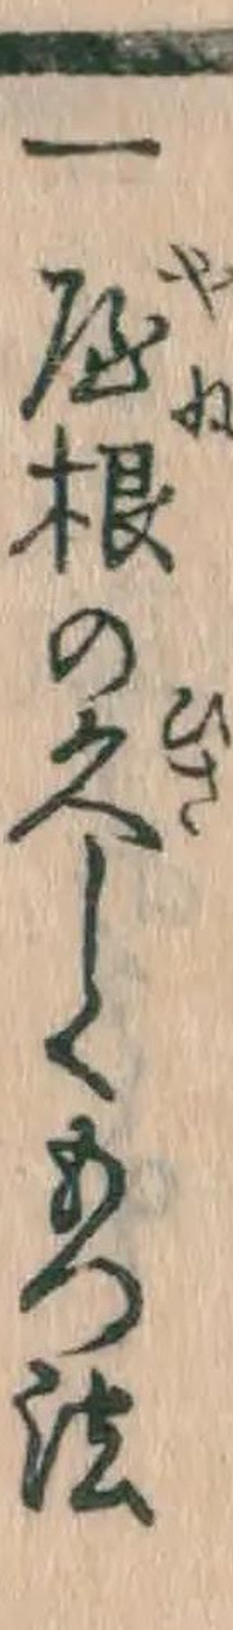一屋根の久しくもつ法
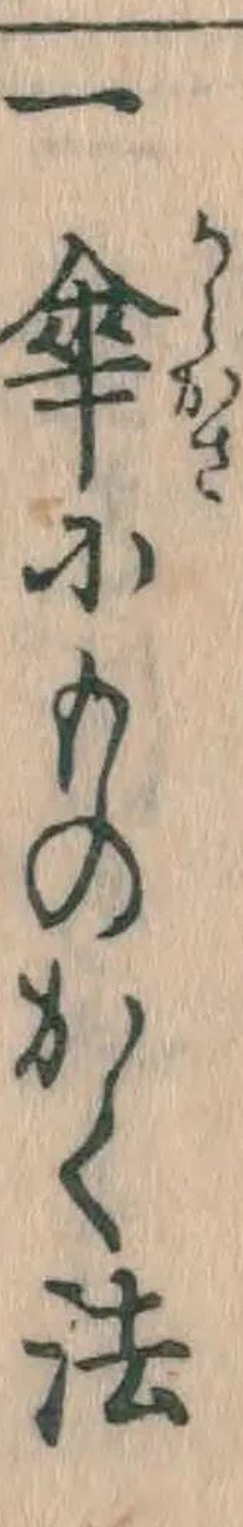一傘にものかく法
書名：広益秘事大全 3巻. [1]
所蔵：国立国会図書館 National Diet Library, JAPAN
